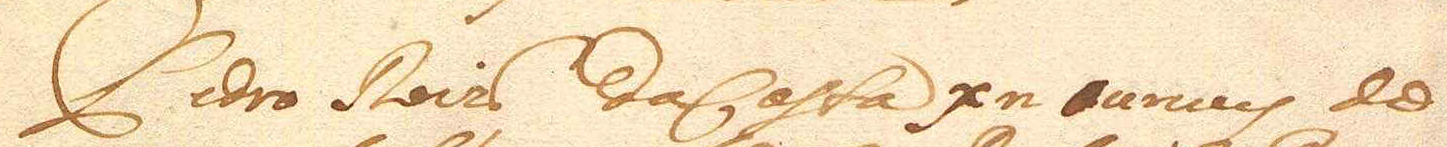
Pedro Roiz̄ da Costa x n ouriues do
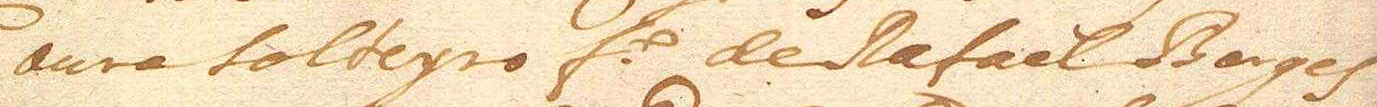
ouro solteyro f.o de Rafael Borges
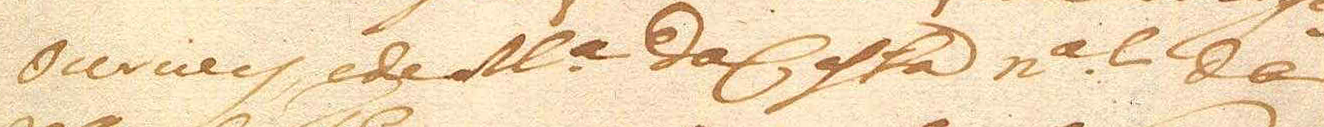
ouriues, e de M.a da Costa n.al da
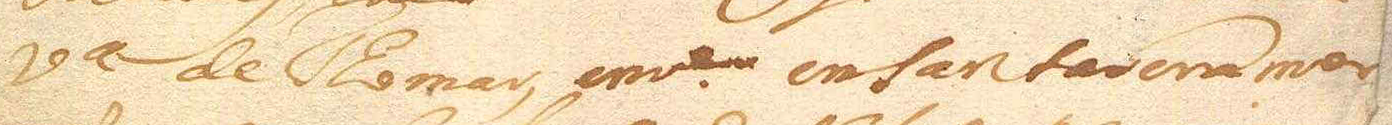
va de Thomar, e m.or em santarem mor
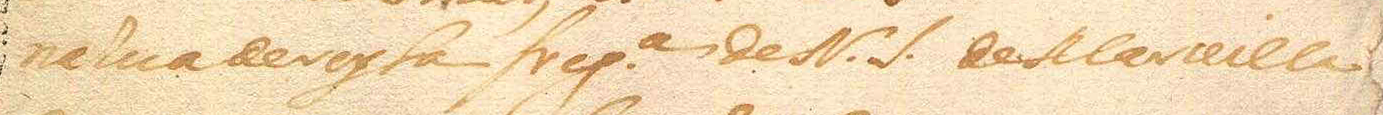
na rua dereyta freg.a de N. S. de Maruilla
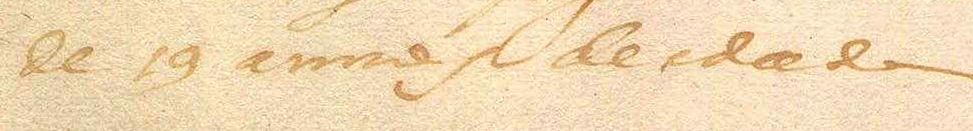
de 19 annos de idade
